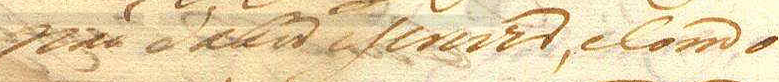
naõ saber escrever, e com o
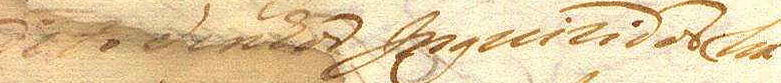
dito senhor Jnquizidor Ma
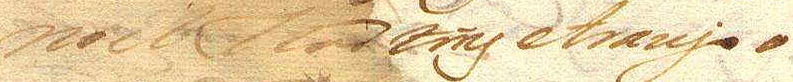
noel Martins Araujo o
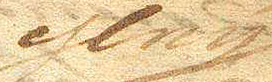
escrevj
